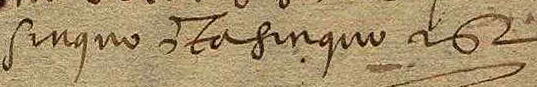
sinquoēta sinquo rs
